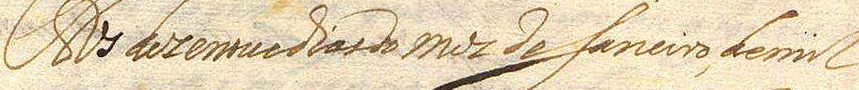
Aos dezenoue dias do mez de Janeiro, de mil
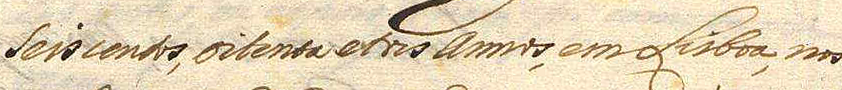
seiscentos, oitenta e tres annos, em Lisboa, nos
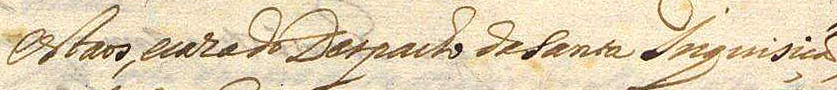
estaos, e caza do Despacho da santa Inquisiçaõ,
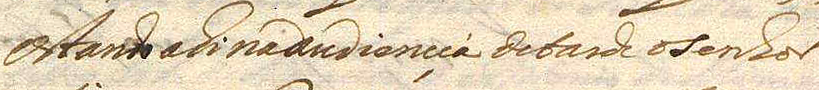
estando ahi na audiençia de tarde o senhor
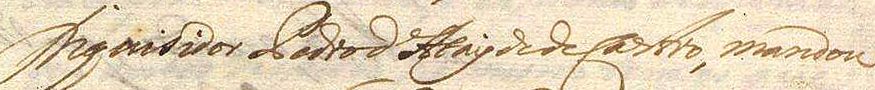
Jnquisidor Pedro de Atayde de Castro, mandou
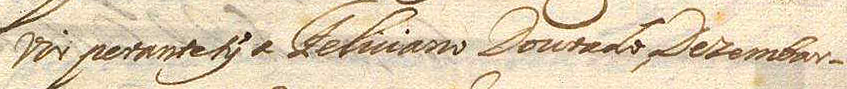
vir perante sy a Feliciano Dourado, Dezembar
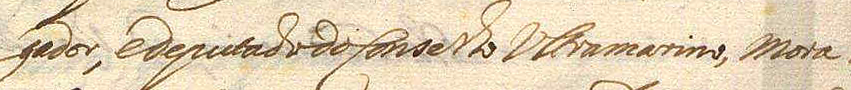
gador, e deputado do Conselho Vltramarino, mora
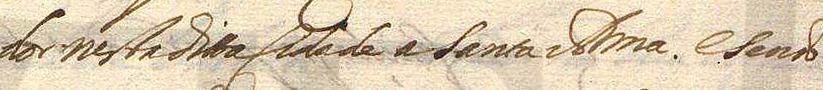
dor nesta ditta Cidade a Santa Anna. e sendo
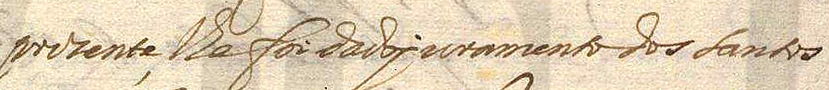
prezente, lhe foi dado juramento dos santos
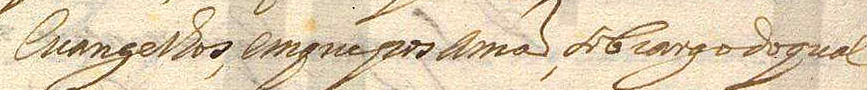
Euangelhos, em que pos a maõ, sob cargo do qual
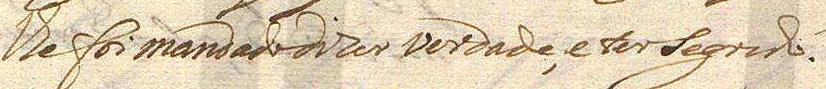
lhe foi mandado dizer verdade, e ter segredo.
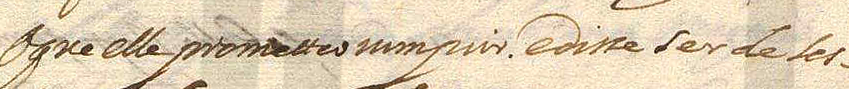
O que elle prometteo cumprir. e disse ser de ses
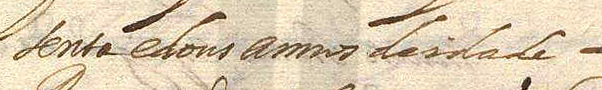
senta e dous annos de idade
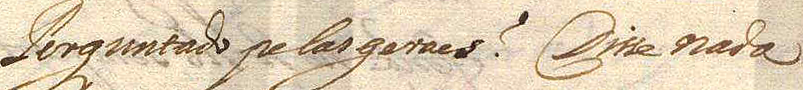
Perguntado pelas geraes? Disse nada
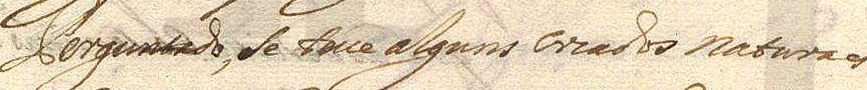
Perguntado, se teue alguns criados naturaes
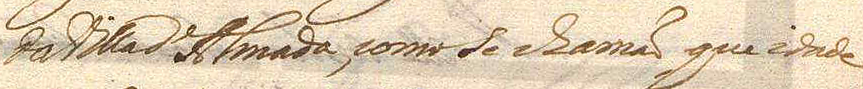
da Villa de Almada, como se chamaõ, que idade
